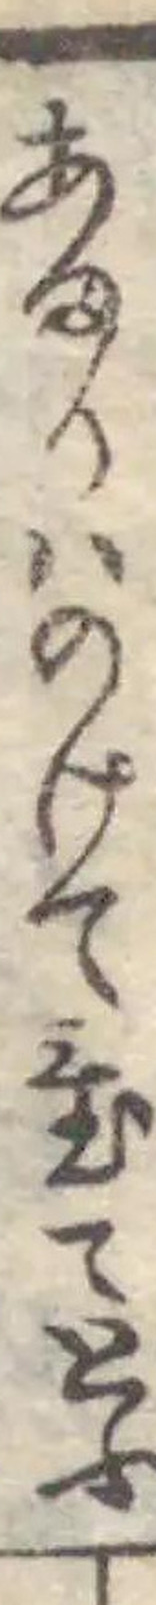あまりはのけて置てどふ
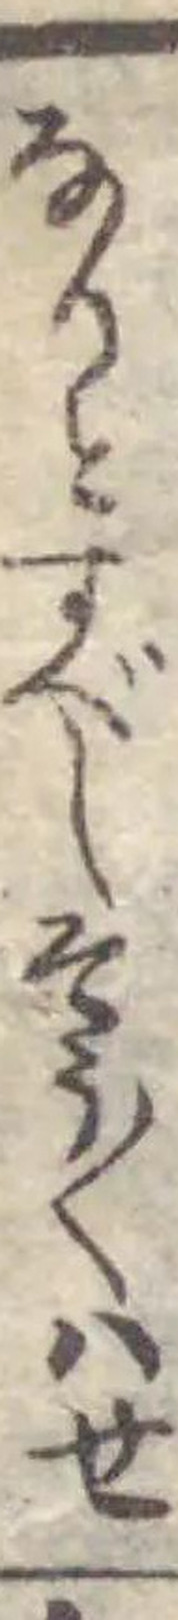なりとすべしそう〳〵はせ
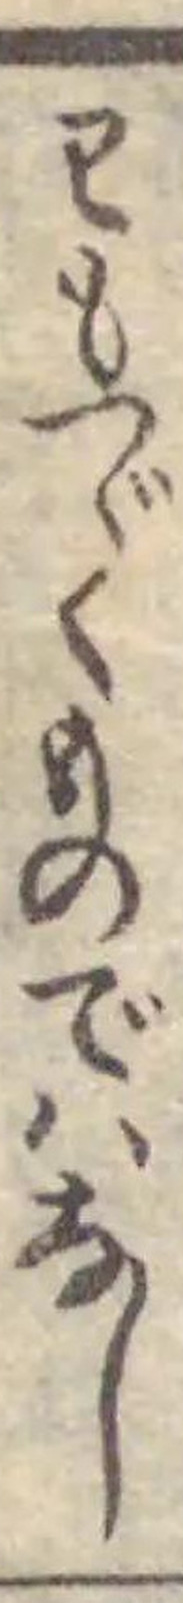わもつゞくものではなし

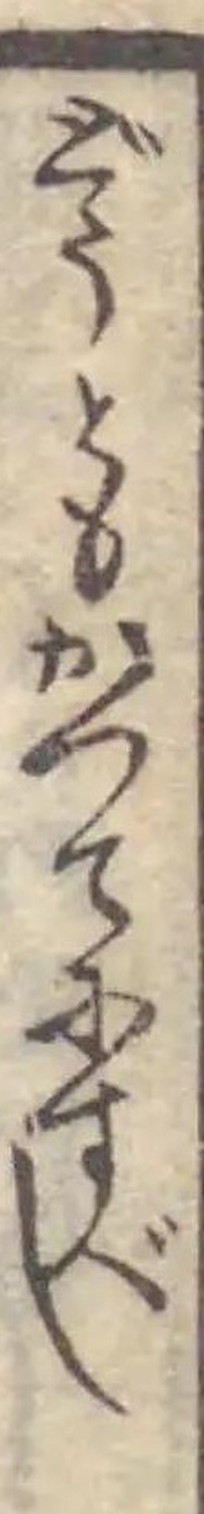どうともかつてにすべし
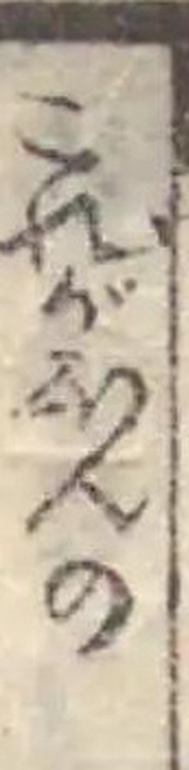これがほんの
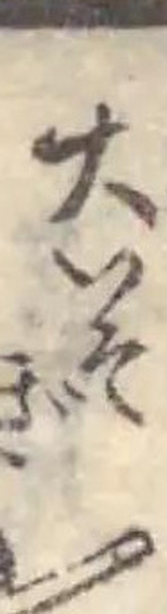大いそ
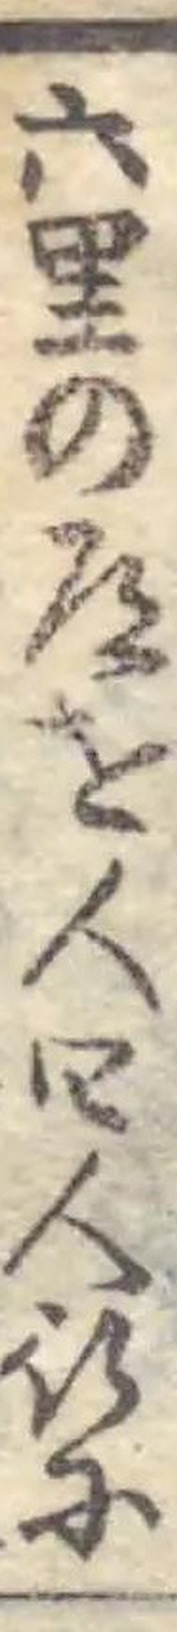六里の道を人四人行に
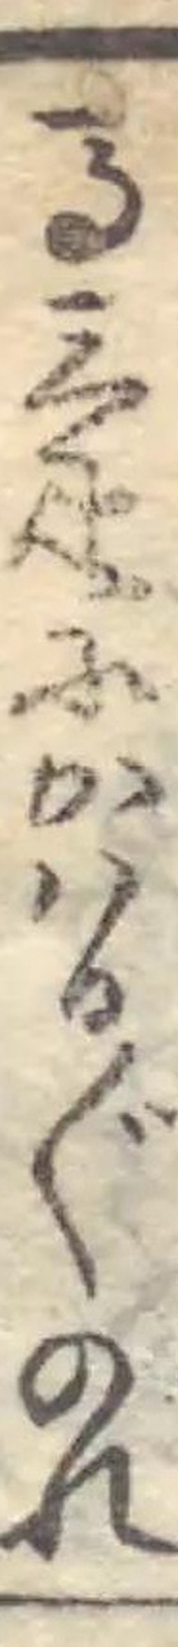馬三疋にかはる〴〵のれ
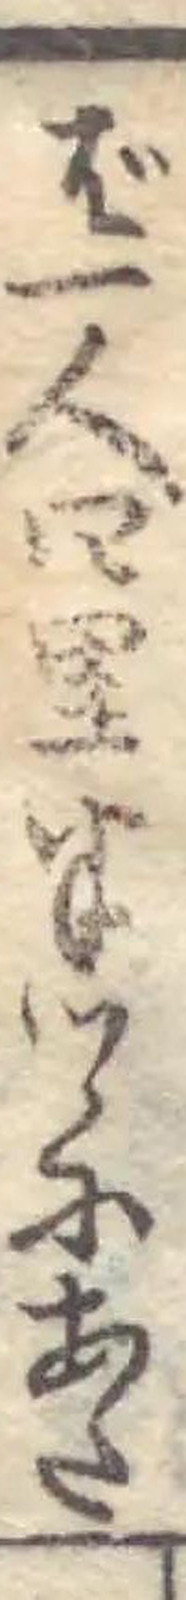ば一人四里繙つゝにあた
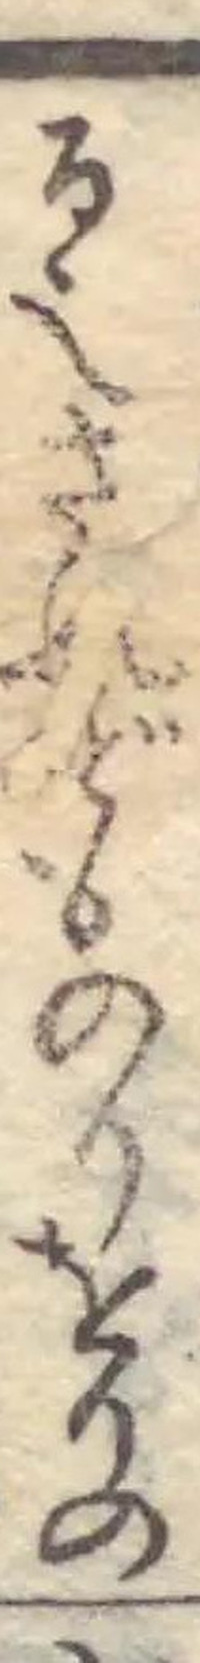る也されどものりをりの
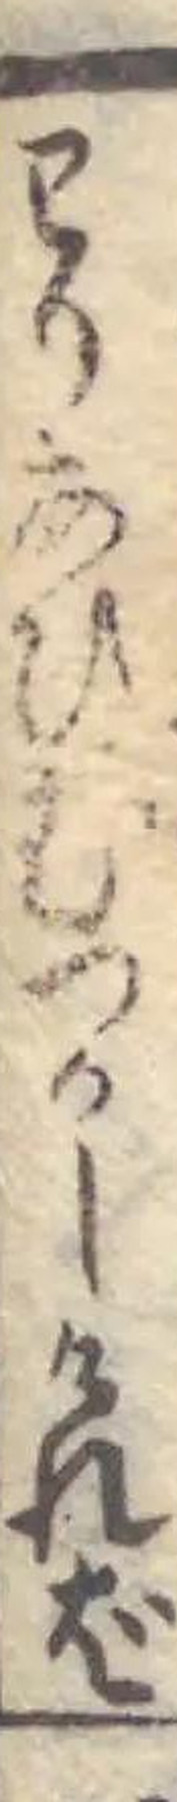わりあひむつかしければ
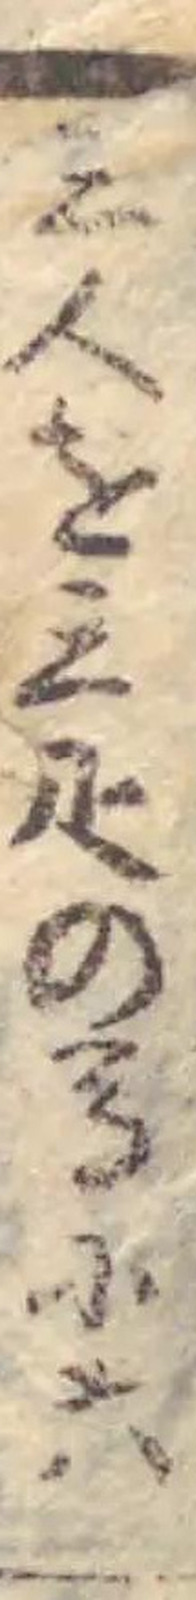三人を三疋の馬に六
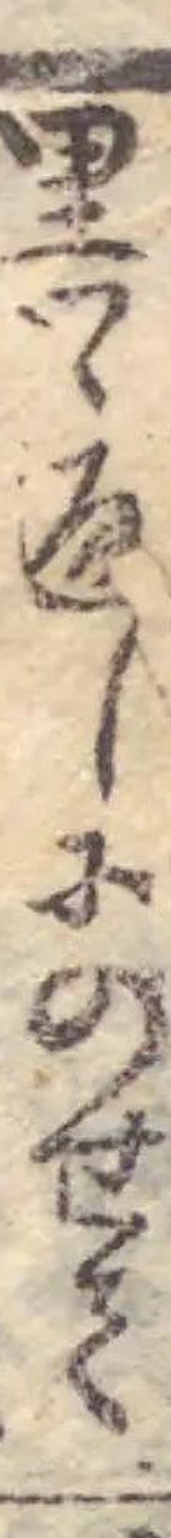里つゝ通しにのせて
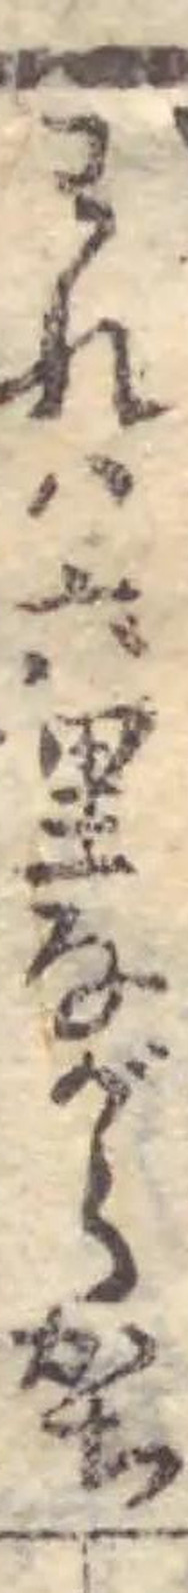われは六里ながらかち
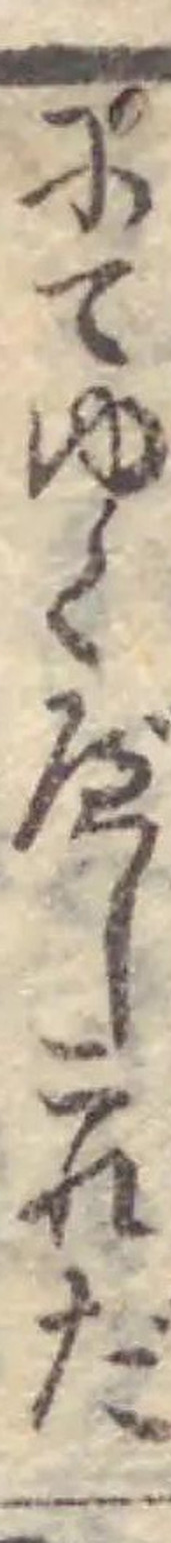にてゆくべしこれだ
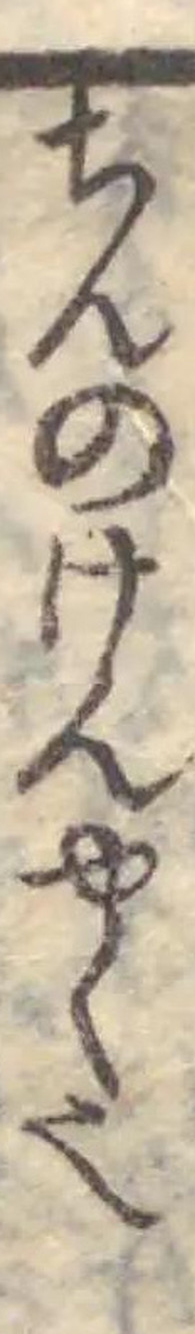ちんのけんやく也
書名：大通人好記
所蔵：国立国会図書館 National Diet Library, JAPAN
